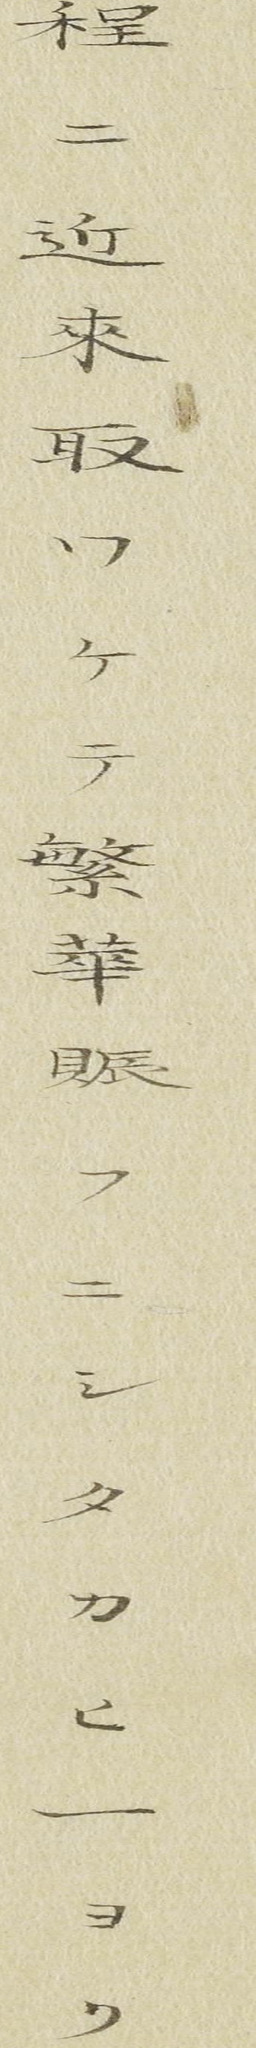程ニ近来取ワケテ繁華賑ヲニシタカヒ一ヨリ
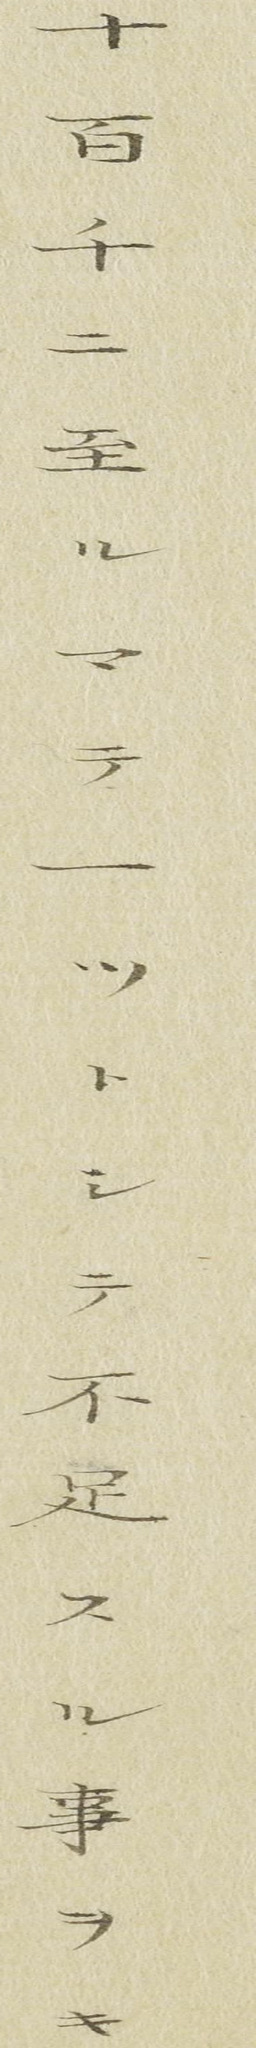十百千ニ至ルマテ一ツトシテ不足スル事ヲキ
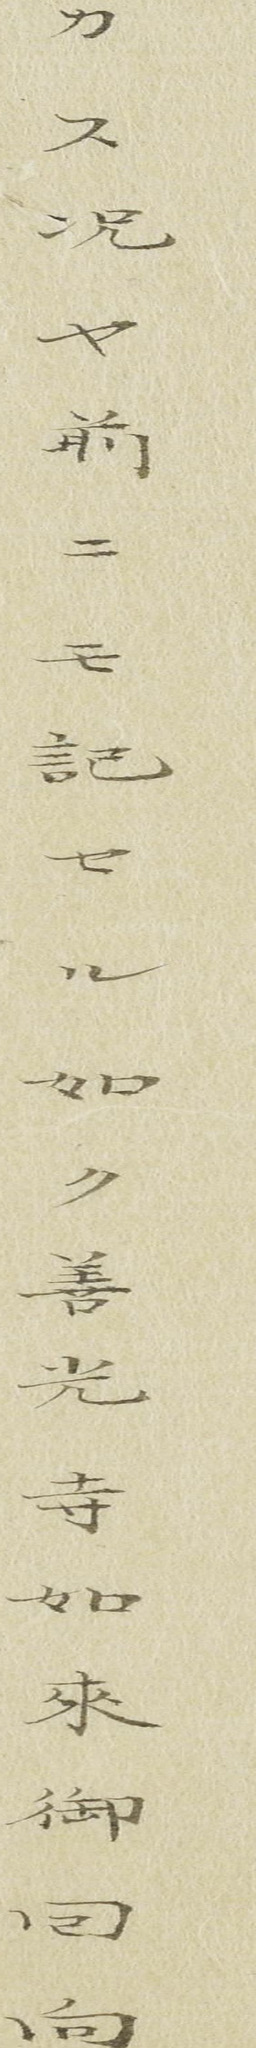カス况ヤ前ニモ記セル如ク善光寺如来御回向
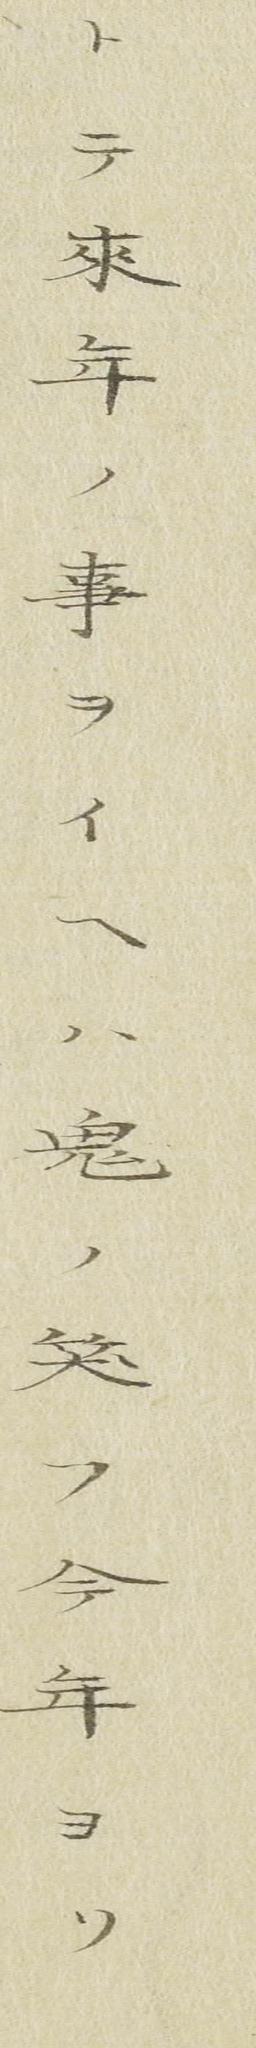トテ来年ノ事ヲイヘハ鬼ノ笑フ今年ヨリ
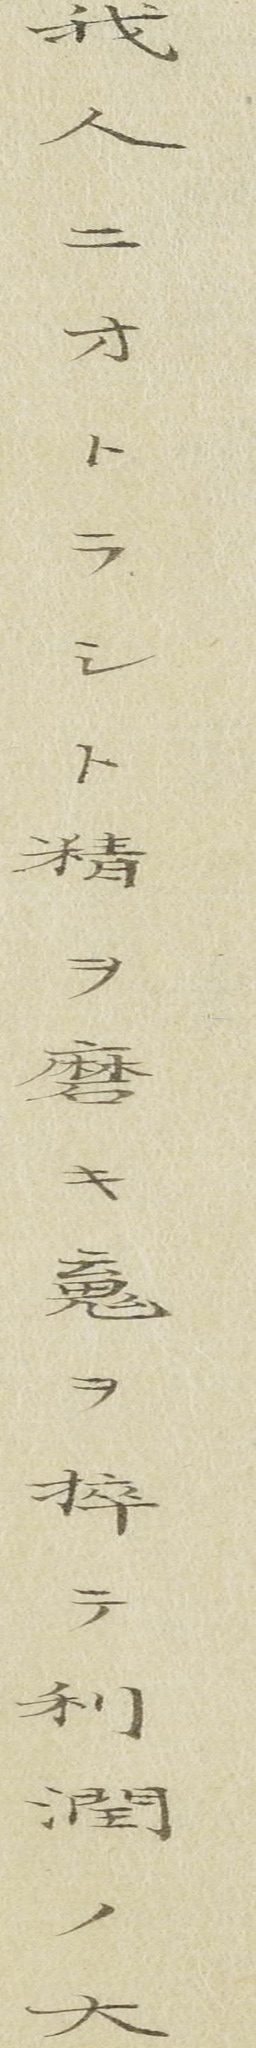我人ニオトラシト精ヲ磨キ鬼ヲ捽テ利潤ノ大
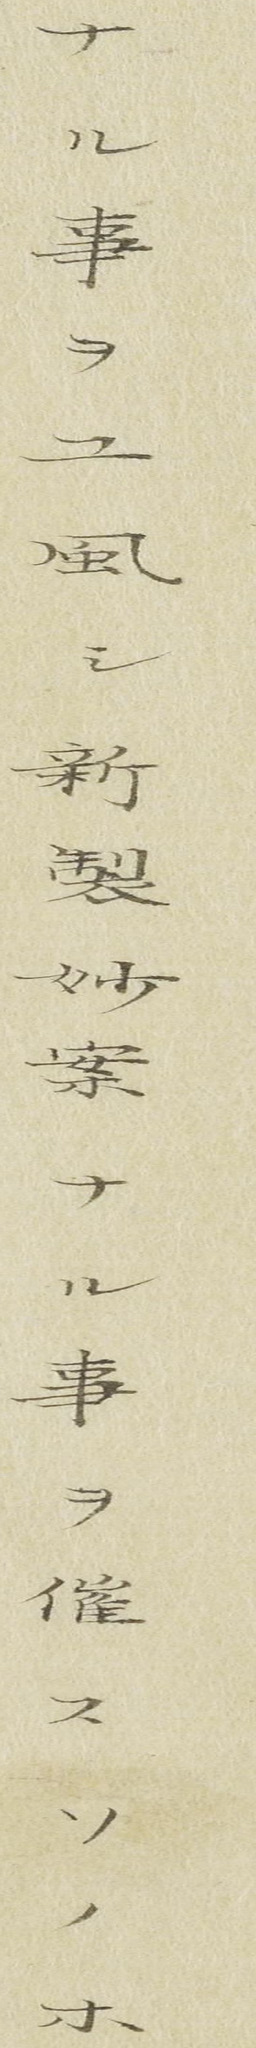ナル事ヲ工風シ新製妙案ナル事ヲ催スソノホ
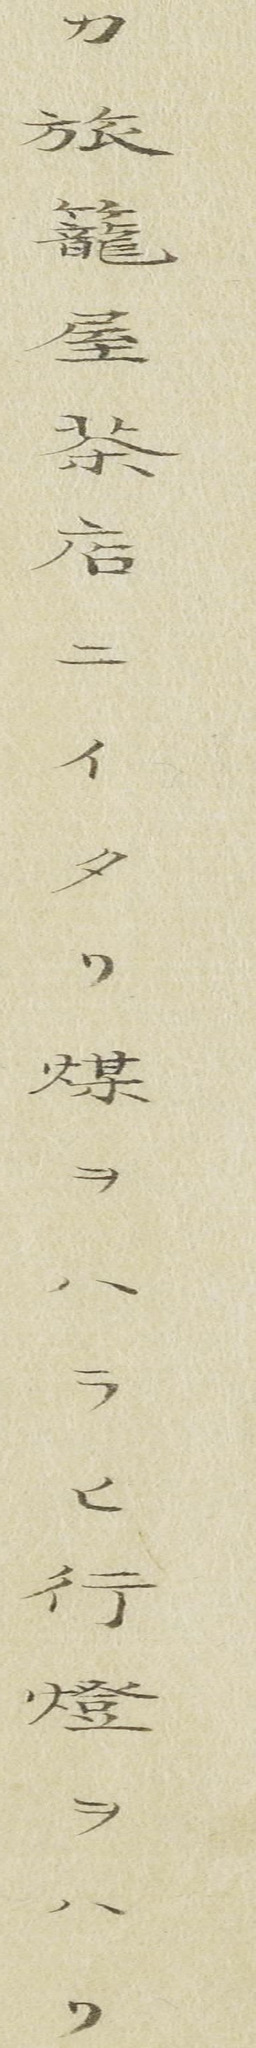カ旅籠屋茶店ニイタリ煤ヲハラヒ行燈ヲハリ
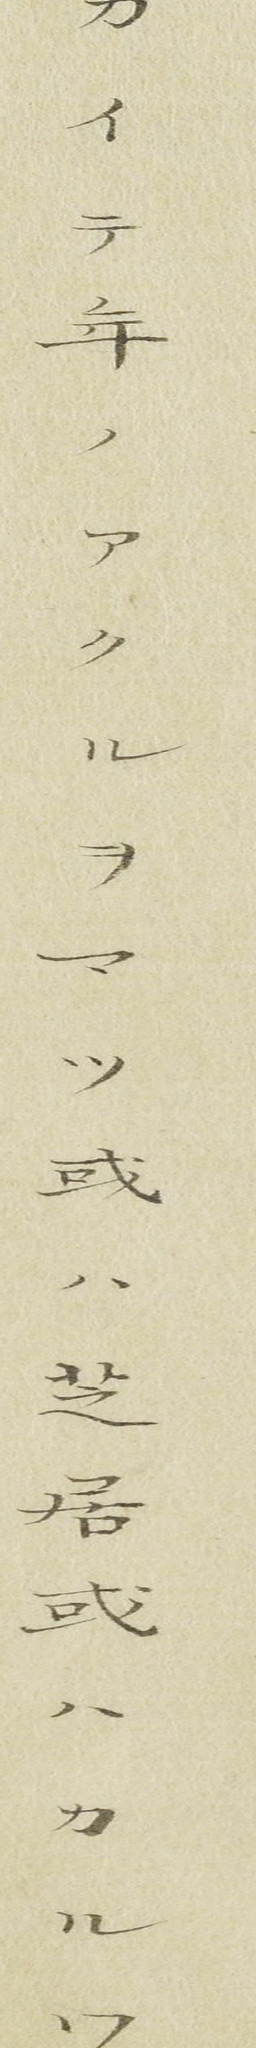カイテ年ノアクルヲマツ或ハ芝居或ハカルワ
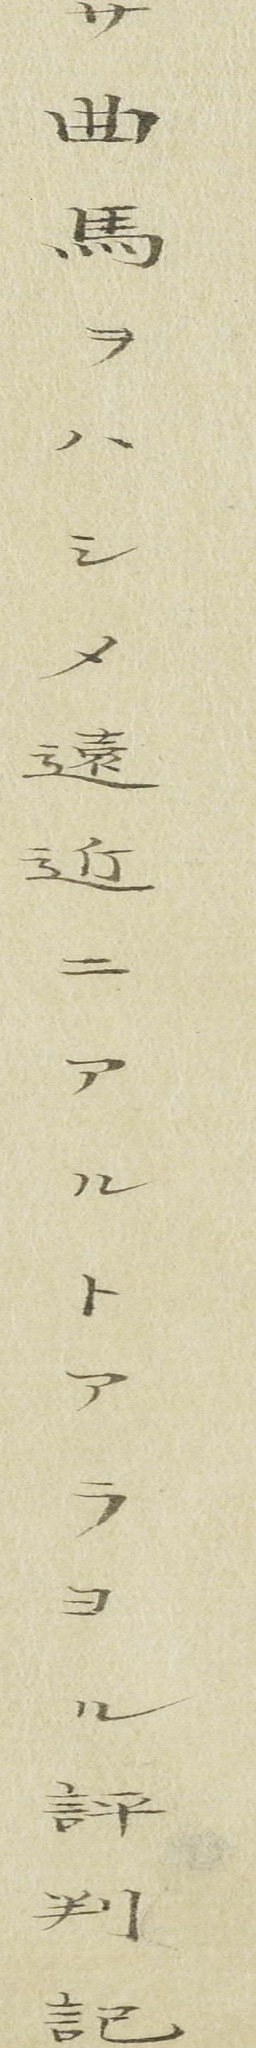サ曲馬ヲハシメ遠近ニアルトアラヨル評判記
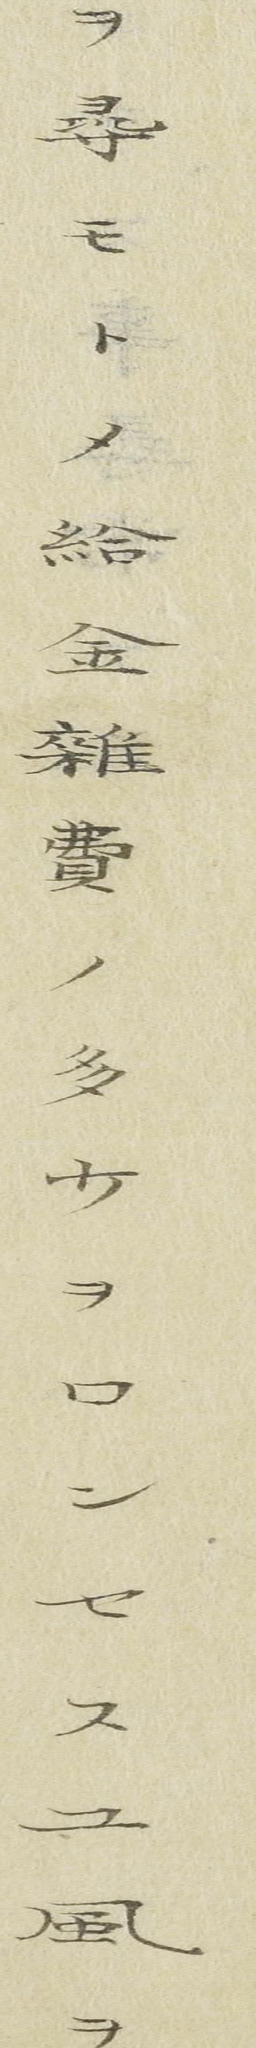ヲ尋モトメ給金雑費ノ多少ヲロンセス工風ヲ

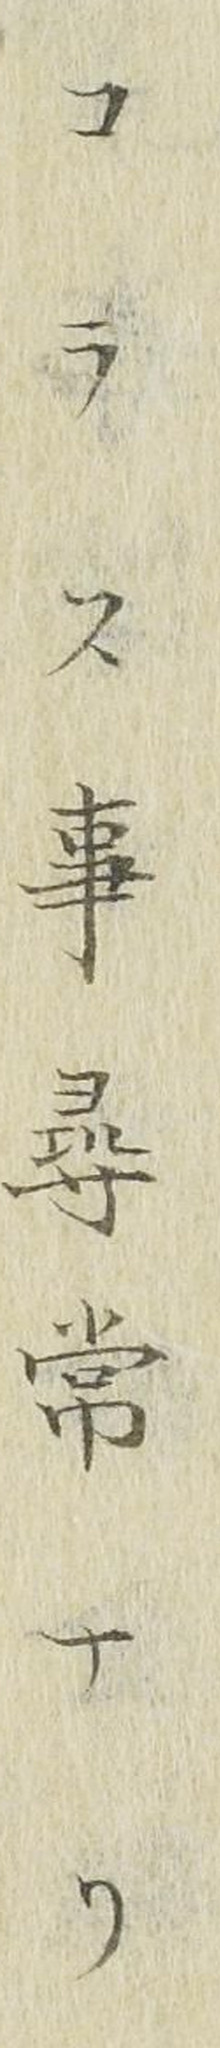コラス事尋常ナリ

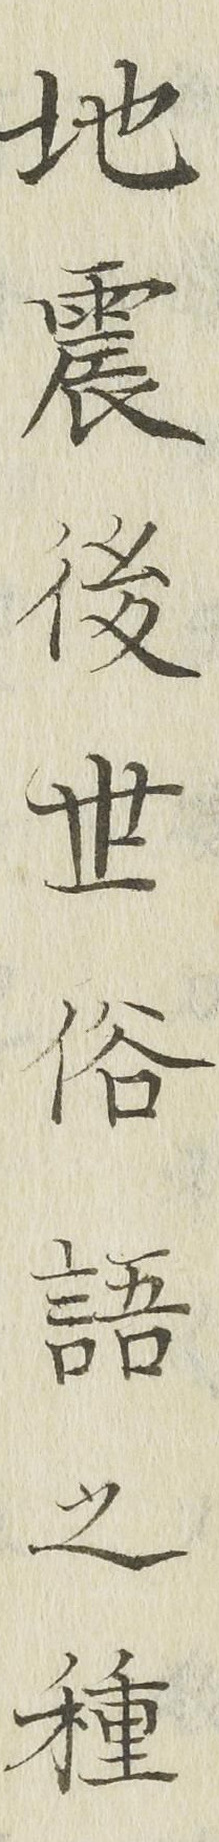地震後世俗語之種

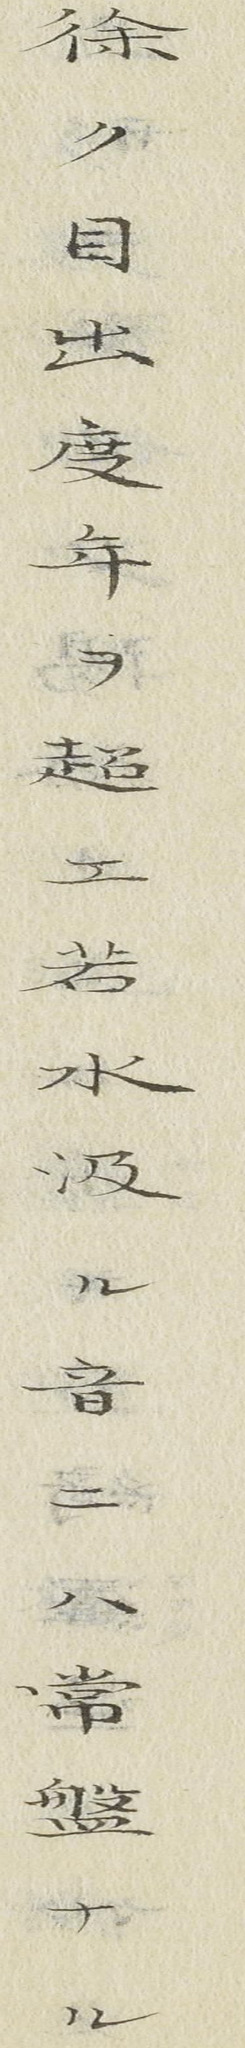徐ク目出度年ヲ超エ若水汲ル音ニハ常盤ナル
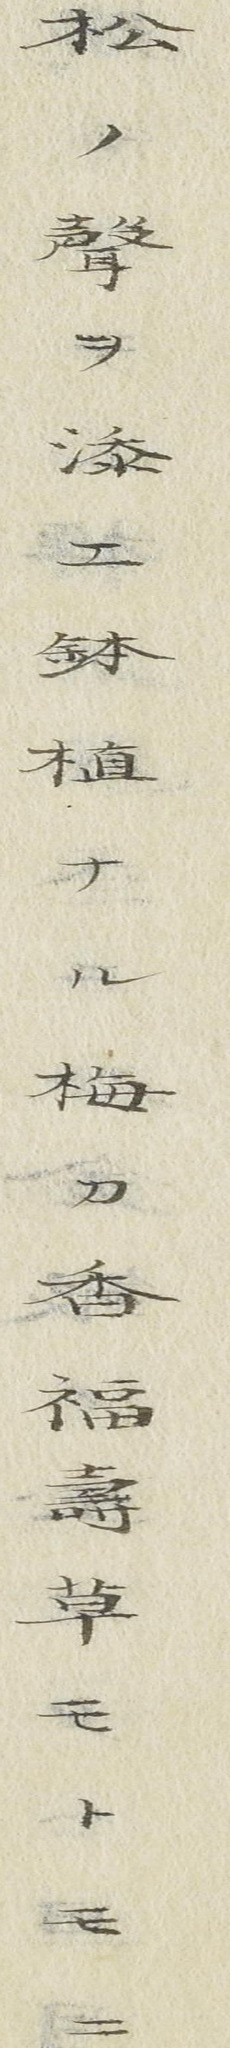松ノ声ヲ添エ鉢植ナル梅カ香福寿草モトモニ
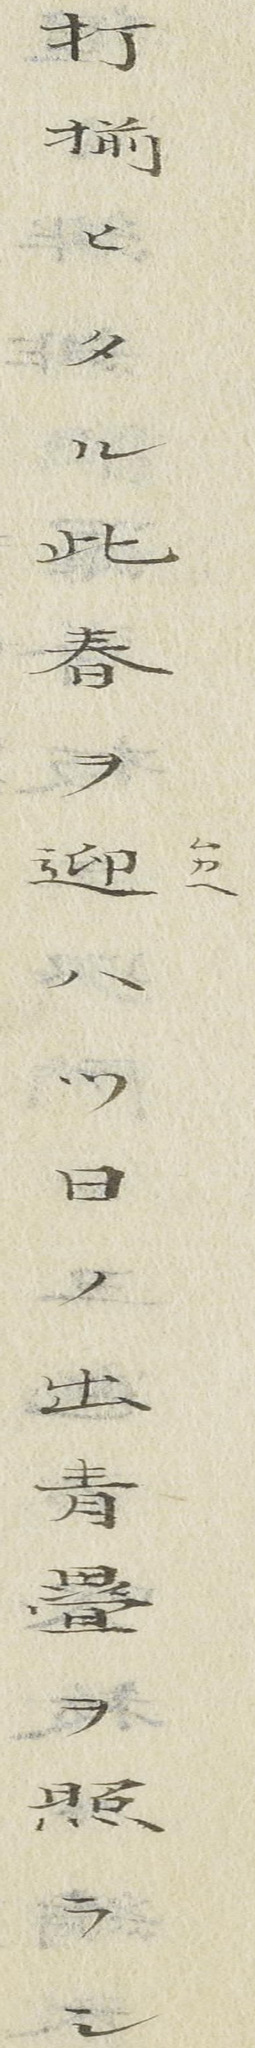打揃ヒタル此春ヲ迎ハツ日ノ出青畳ヲ照ラシ
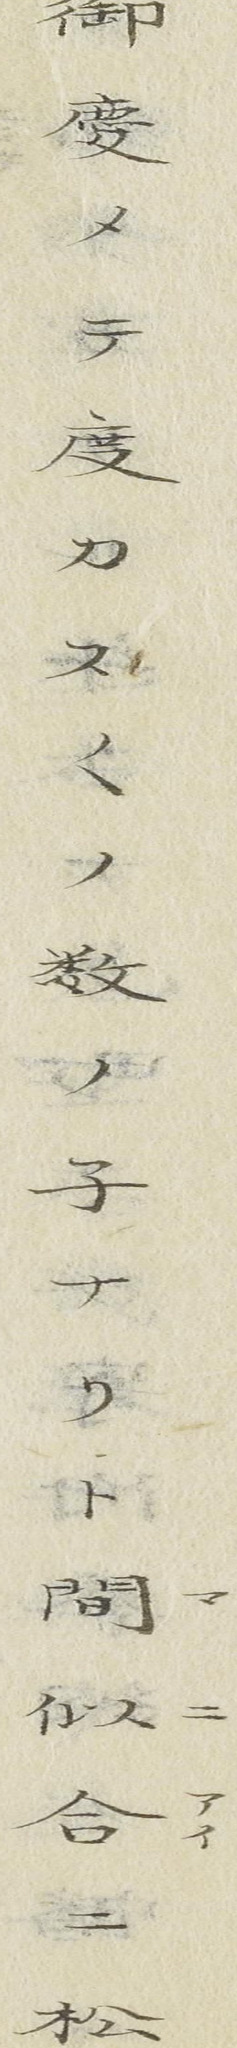御慶メテ度カス〱ノ数ノ子ナリト間似合ニ松
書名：地災撮要　地震之部　巻ノ二
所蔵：東京大学地震研究所図書室 Earthquake Research Institute Library, The University of Tokyo, JAPAN
